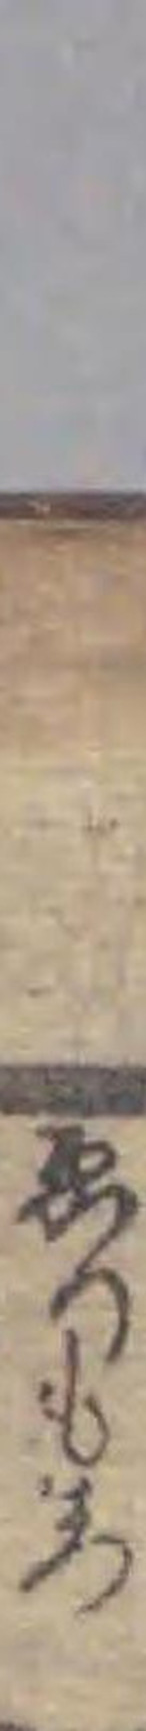ゑりもまつ
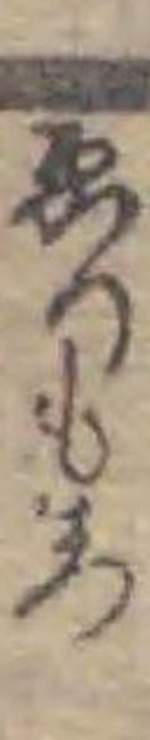ゑりもまつ
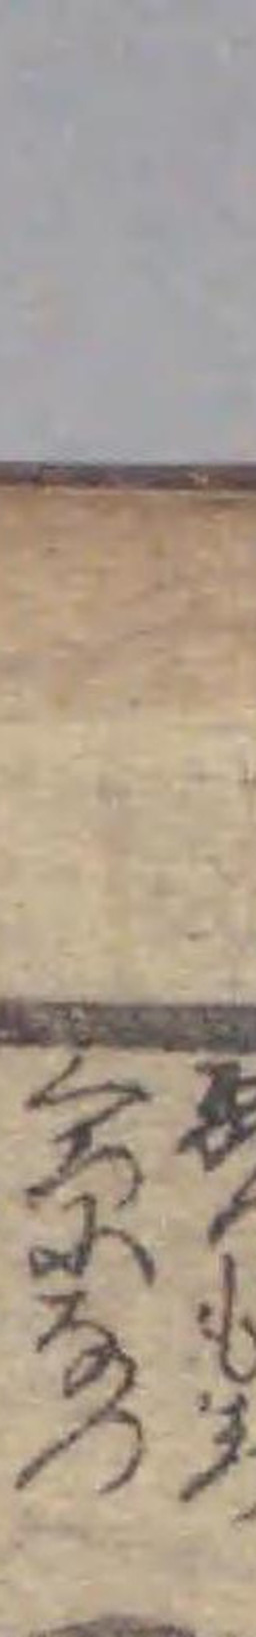くろになつ
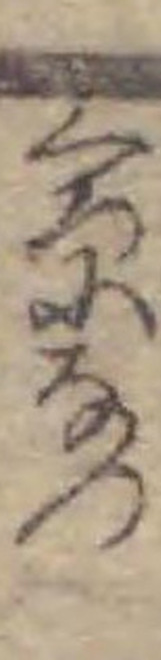くろになつ
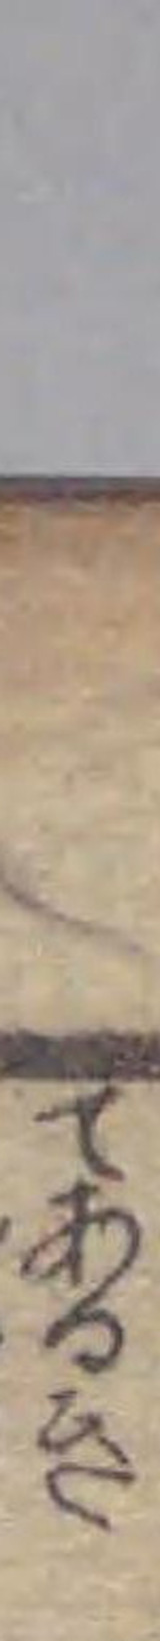てあるき
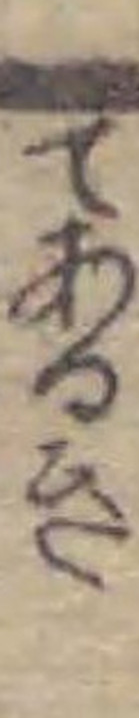てあるき
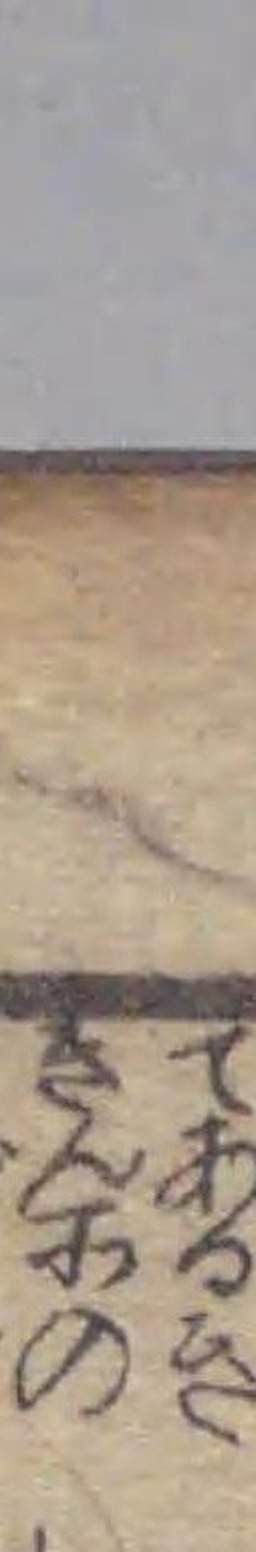きん所の
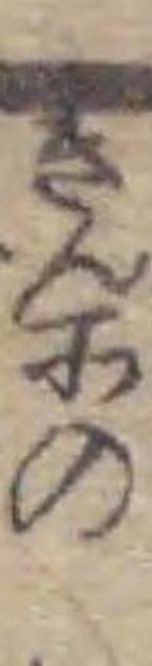きん所の
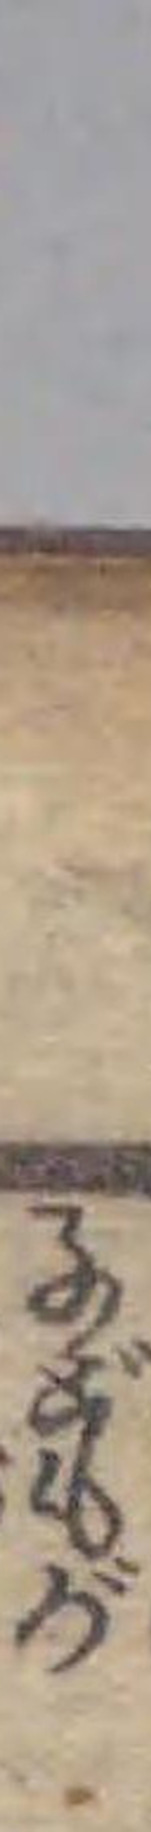子どもが
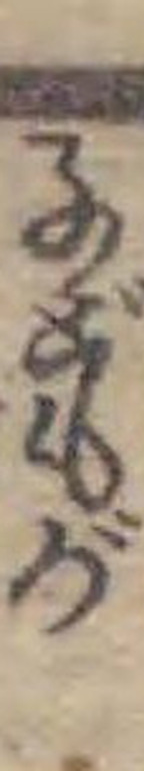子どもが
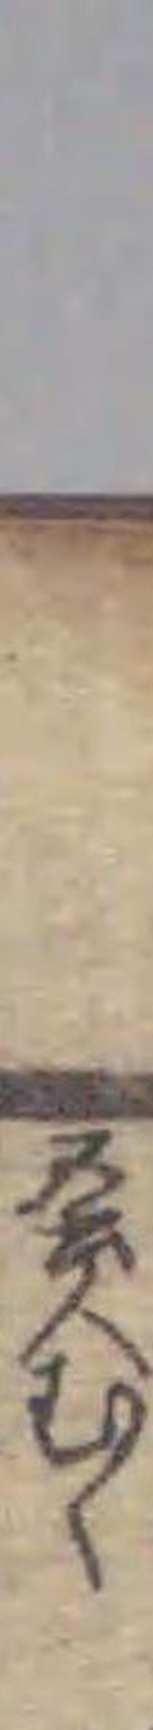五六人むく
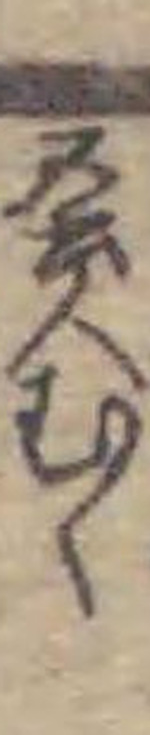五六人むく
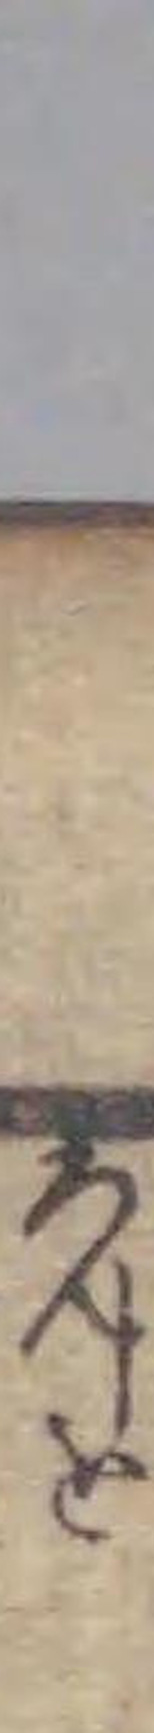ろんじを
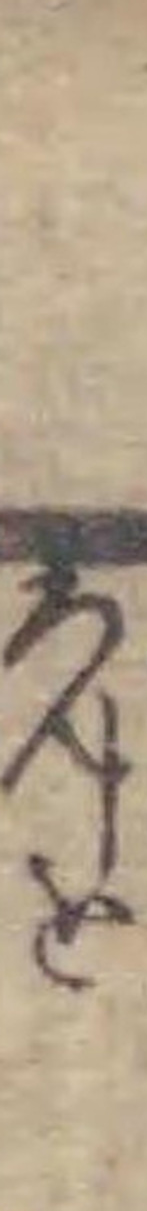ろんじを
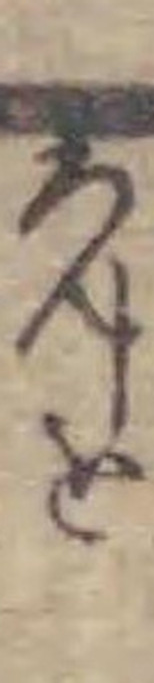ろんじを
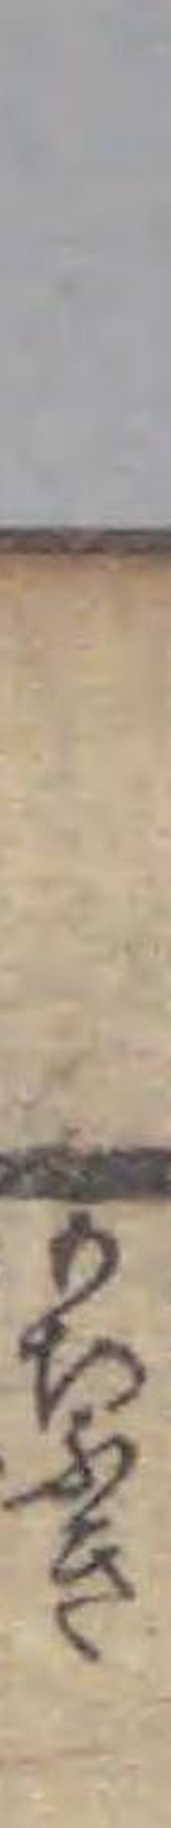もちふき
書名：通風伊勢物語 : 3巻
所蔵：国立国会図書館 National Diet Library, JAPAN
